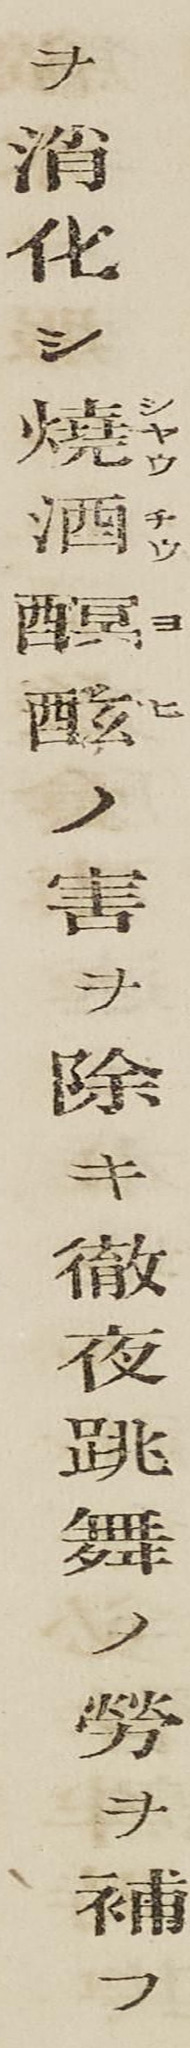ヲ消化シ焼酒ヨヒノ害ヲ除キ徹夜跳舞ノ労ヲ補フ
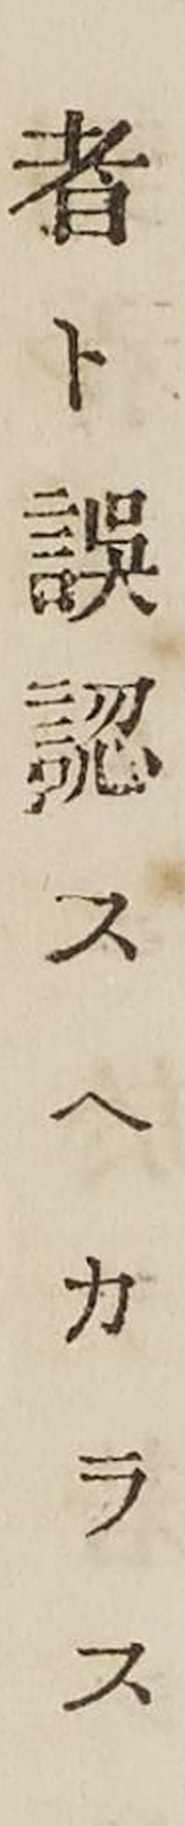者と誤認スルヘカラス
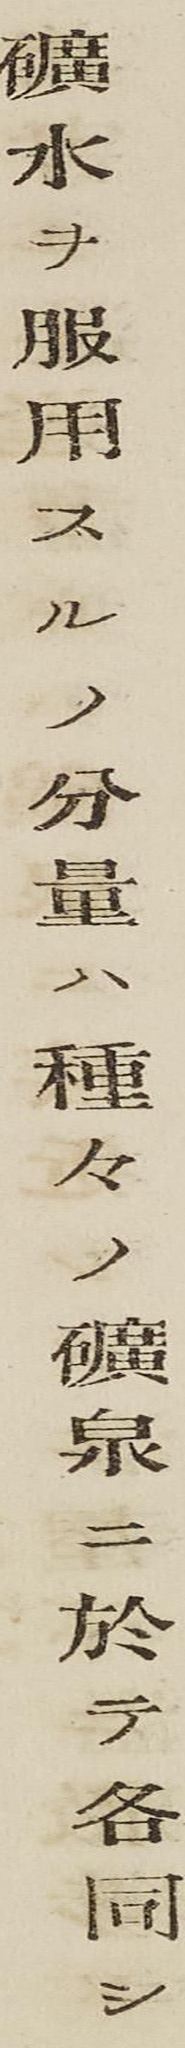礦水ヲ服用スルノ分量ハ種々ノ礦水ニ於テ各同シ
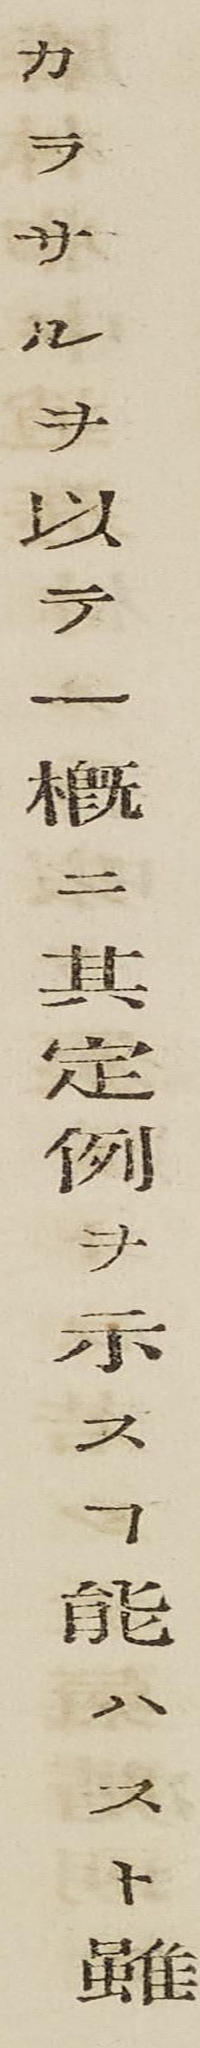カラサルヲ以テ一概ニ其定例ヲ示スコト能ハスト雖
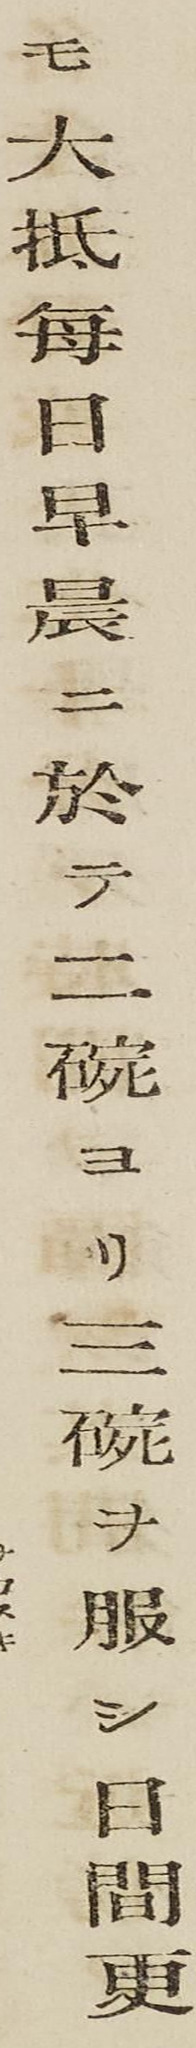モ大抵毎日早晨ニ於テ二碗ヨリ三碗ヲ服シ日間更
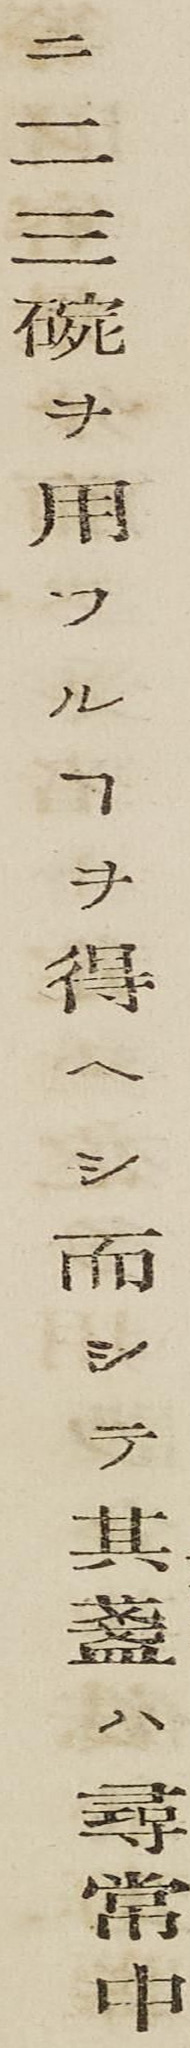ニ二三碗ヲ用フルコトヲ得ヘシ而シテ其盞ハ尋常中
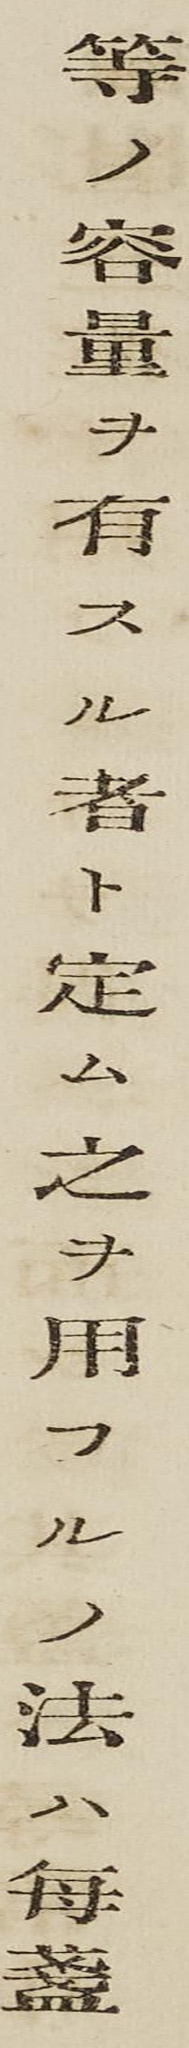等ノ容量ヲ有スル者ト定ム之ヲ用フルノ法ハ毎盞
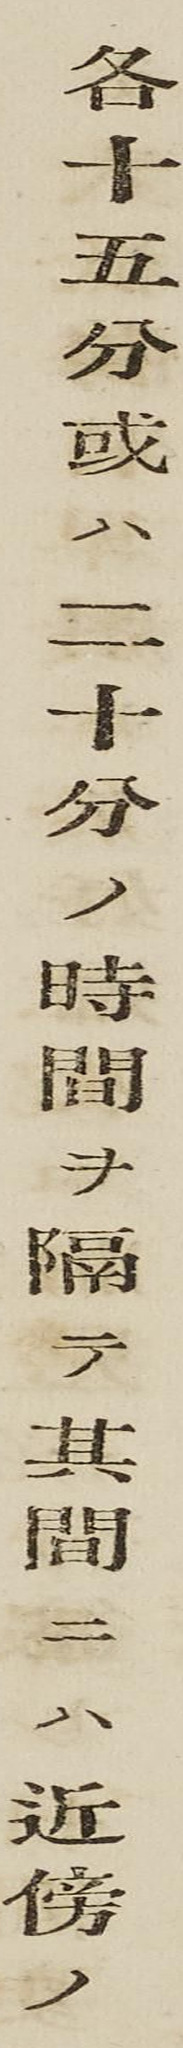各十五分或ハ二十分ノ時間ヲ隔テ其間ニハ近傍ノ
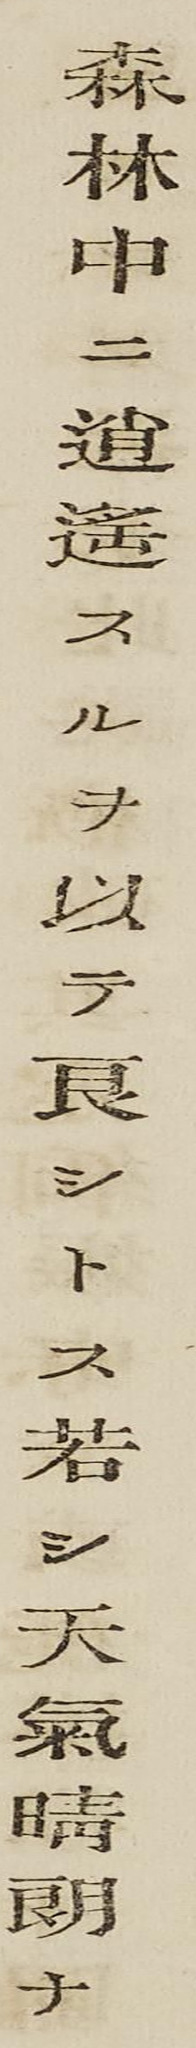森林中ニ逍遥スルヲ以テ良シトス若シ天気晴朗ナ
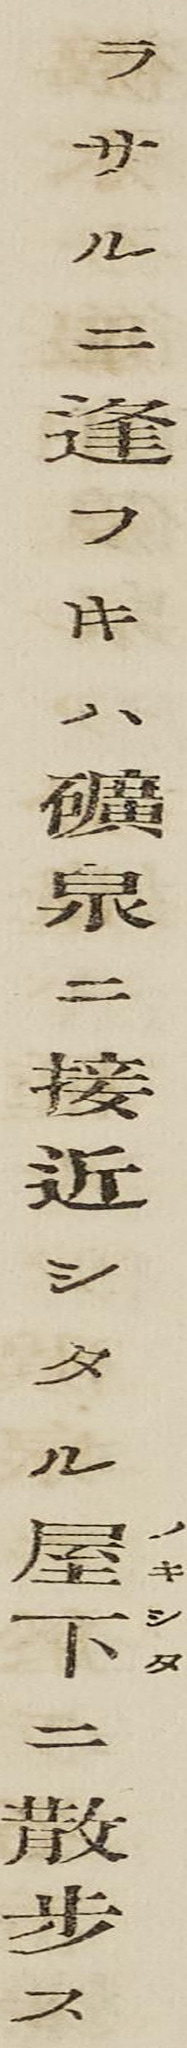ラサルニ逢フトキハ礦泉ニ接近シタル屋下ニ散歩ス
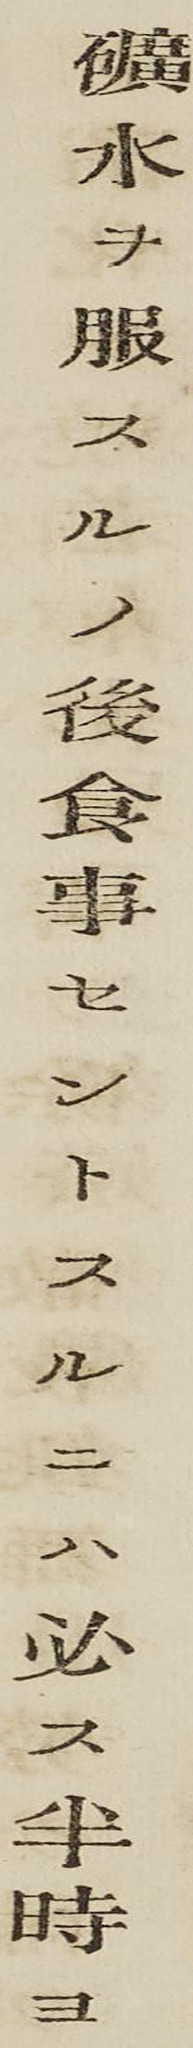礦水ヲ服スルノ後食事セントスルニハ必ス半時ヨ
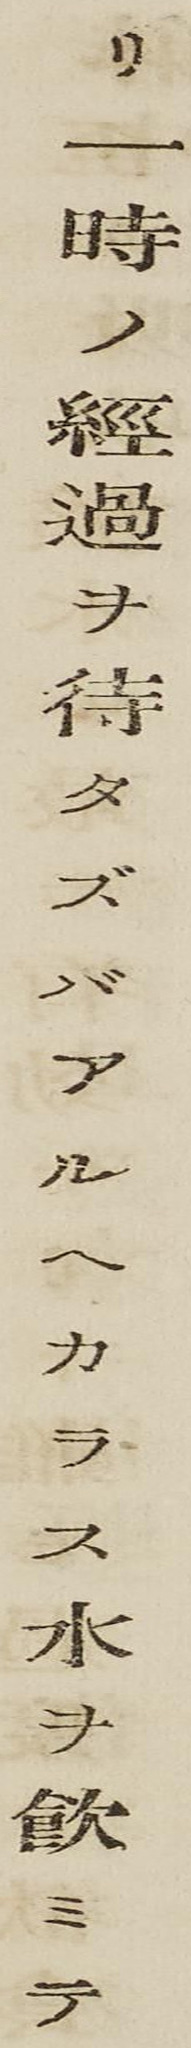リ一時ノ経過ヲ待タズバアルヘカラス水ヲ飲ミテ
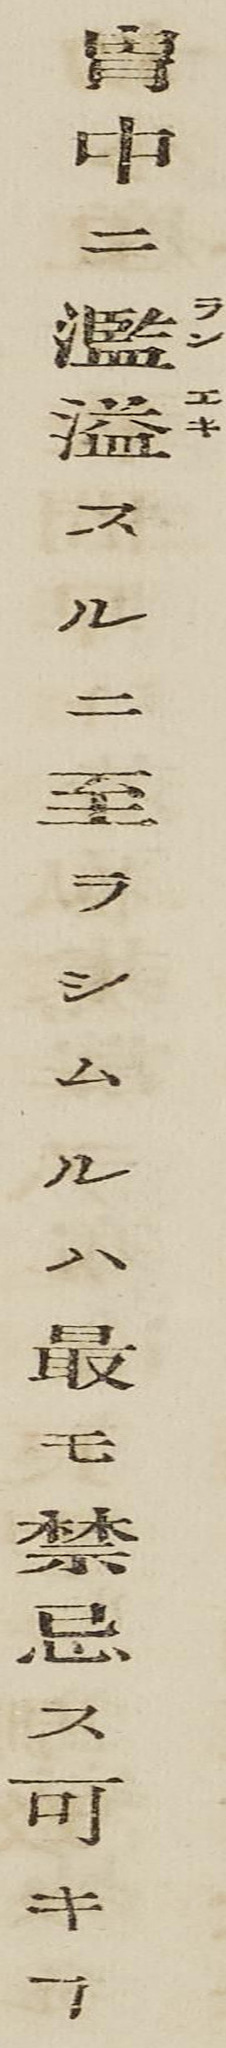胃中ニ濫溢スルニ至ラシムルハ最モ禁忌ス可キコト
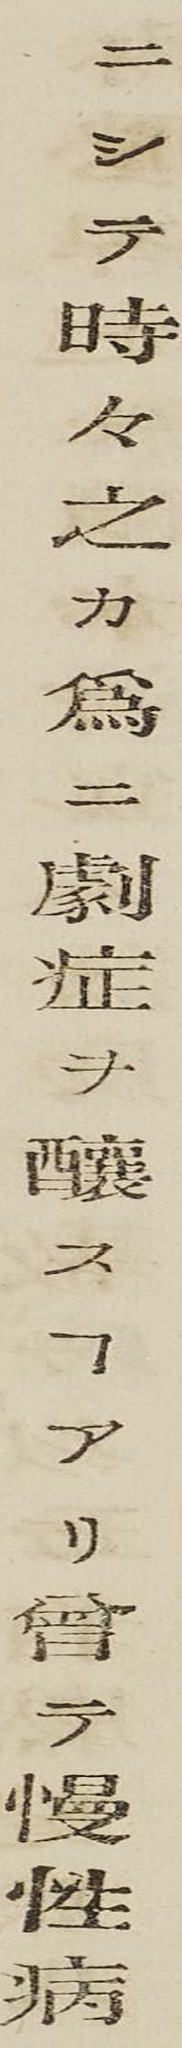ニシテ時々之カ為ニ劇症ヲ醸スコトアリ曽テ慢性病
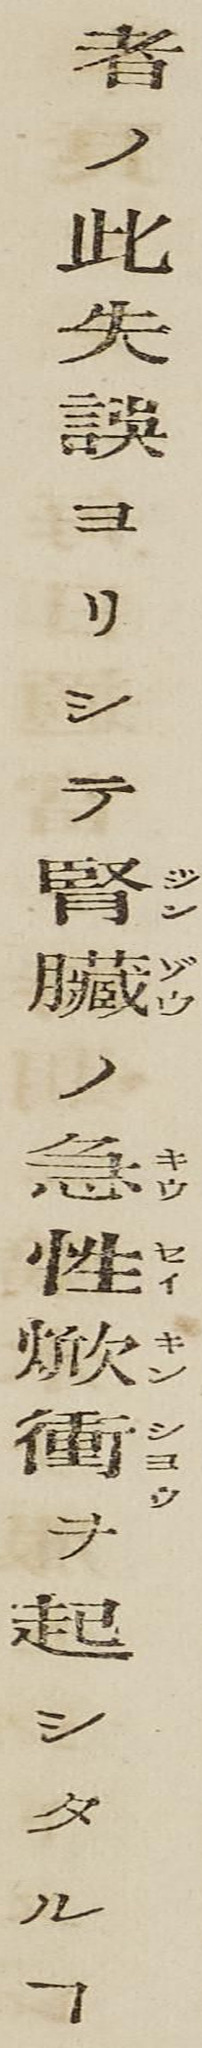者ノ此失誤ヨリシテ腎臓ノ急性焮衝ヲ起シタルコト

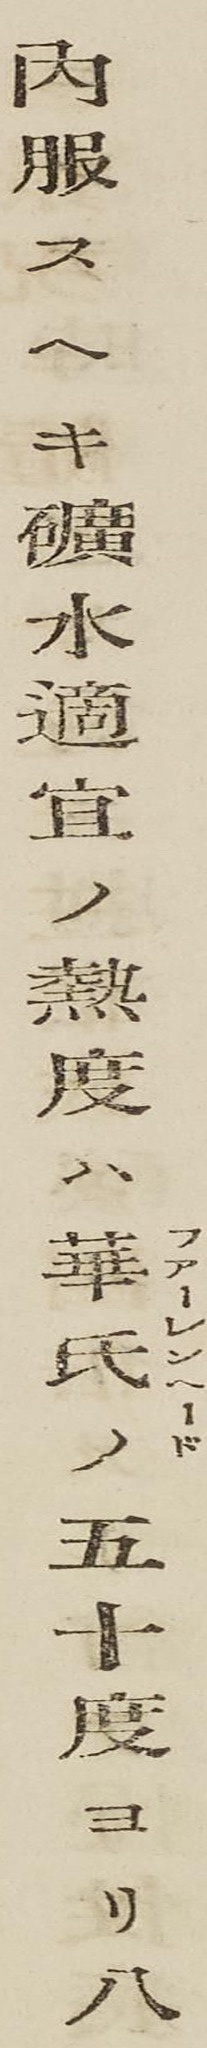内服スヘキ礦水適宜ノ熱度ハ華氏ノ五十度ヨリ八
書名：日本温泉考
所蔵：東京大学地震研究所図書室 Earthquake Research Institute Library, The University of Tokyo, JAPAN
